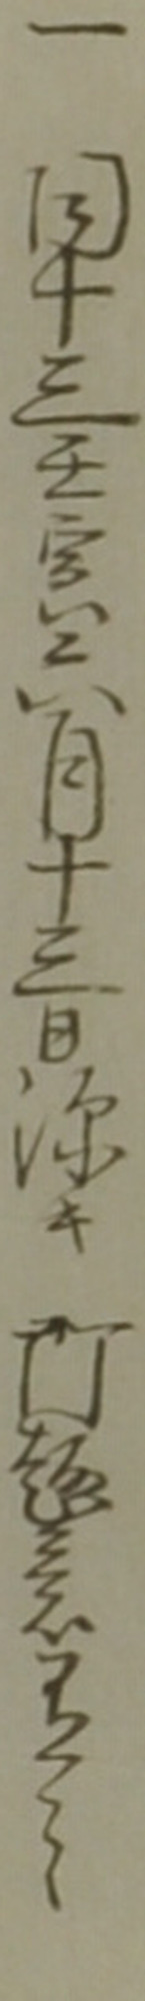一同十三壬寅六月十三日深キ御趣意有之

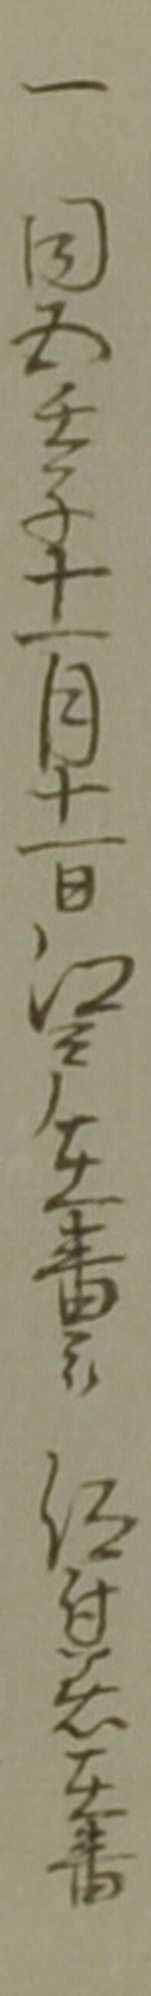一同五壬子十一月十一日江戸在番被仰付着在番
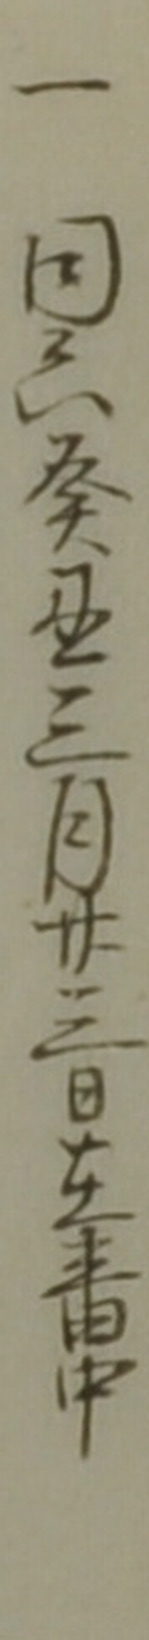一同六癸丑三月廿三日在番中
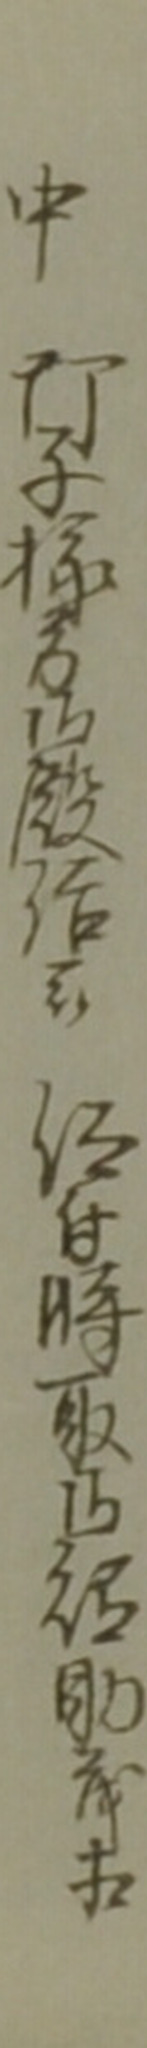中御子様方御殿詰被仰付時取御賄助茂相
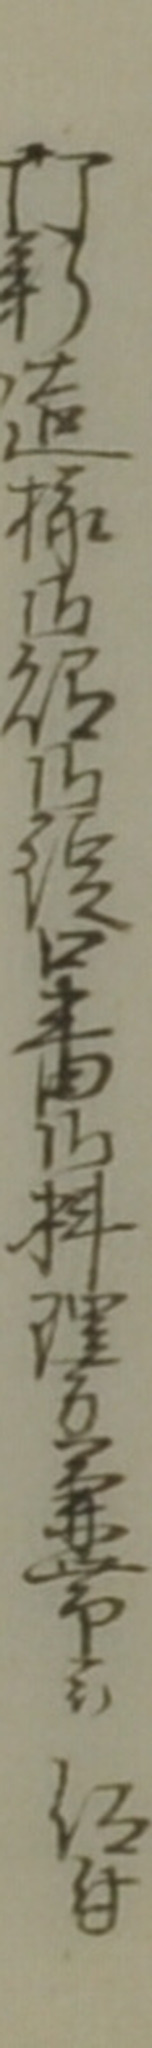御新造様御賄御錠口番御料理方兼帯被仰付
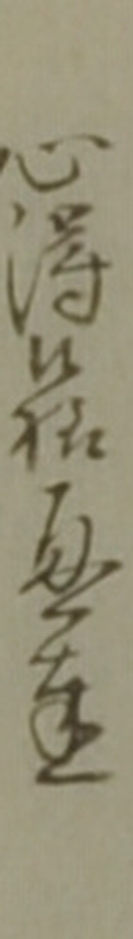心得候様通達
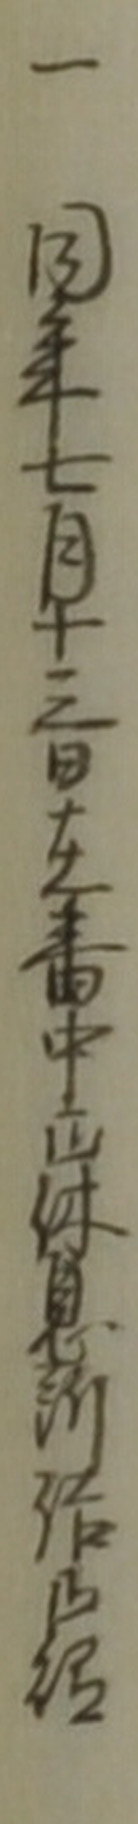一同年七月十三日在番中御休息所詰御賄
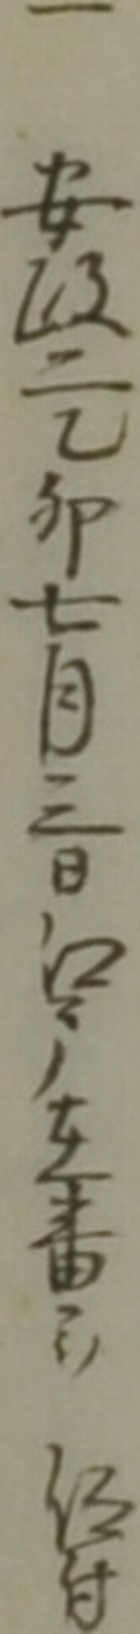一安政二乙卯七月三日江戸在番被仰付
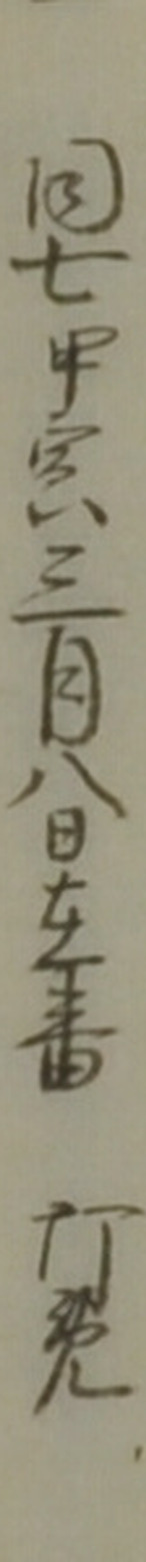一同七甲寅三月八日在番御免
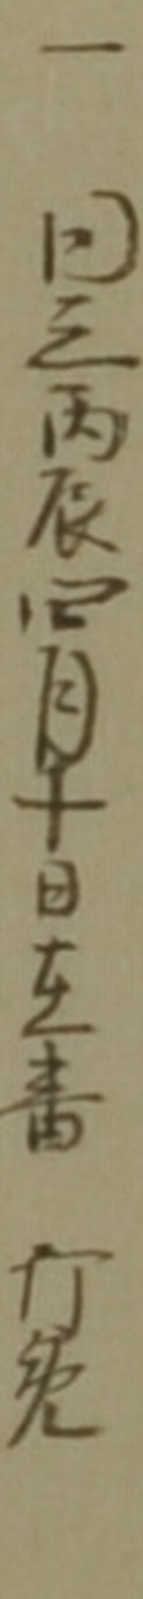一同三丙辰四月十日在番御免
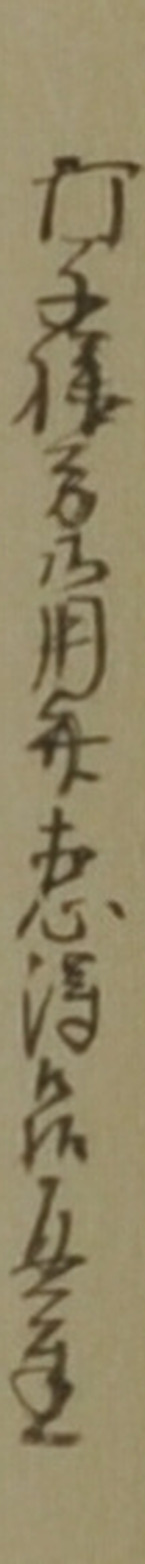御子様方御用弁相心得候様通達

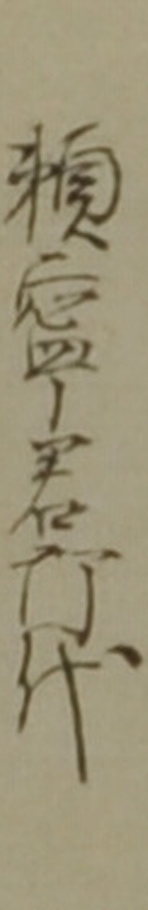頼寧君御代
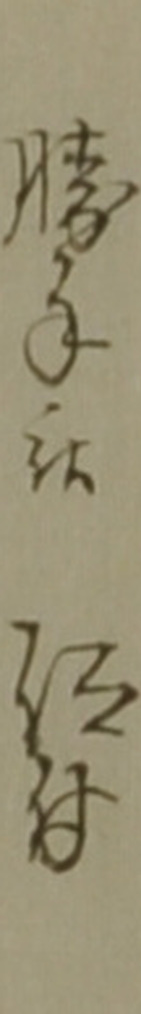勝手被仰付
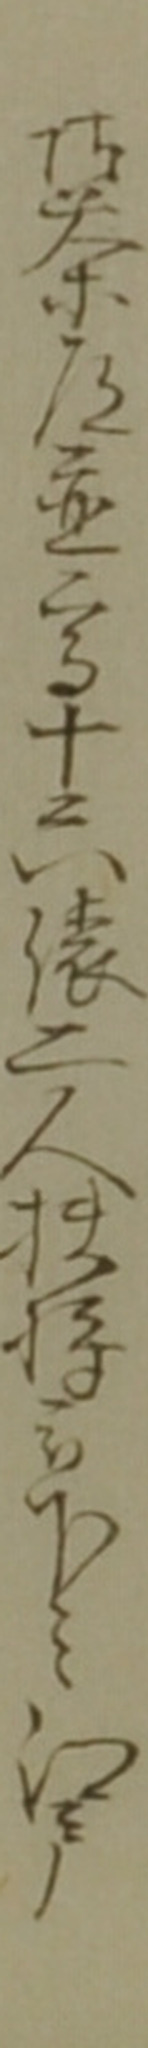御茶道並高十六俵二人扶持被下之江戸
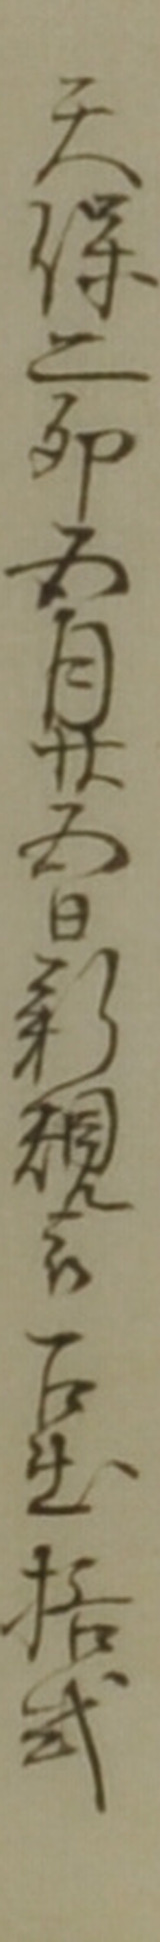一天保二卯五月廿五日新規被召出格式
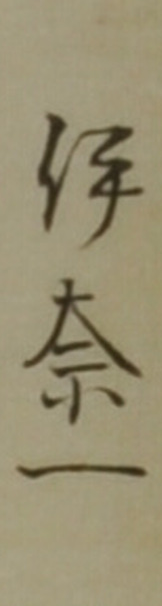伊奈一
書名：無足諸士勤仕録（六）
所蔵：伊那市立高遠町図書館・合同会社AMANE
